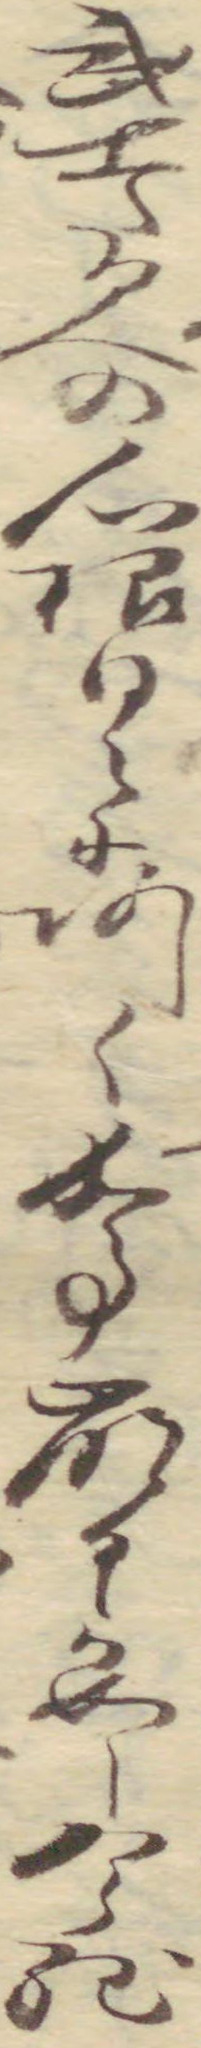武士たる人の心根日〻にあしく成事崩るゝか如し今程
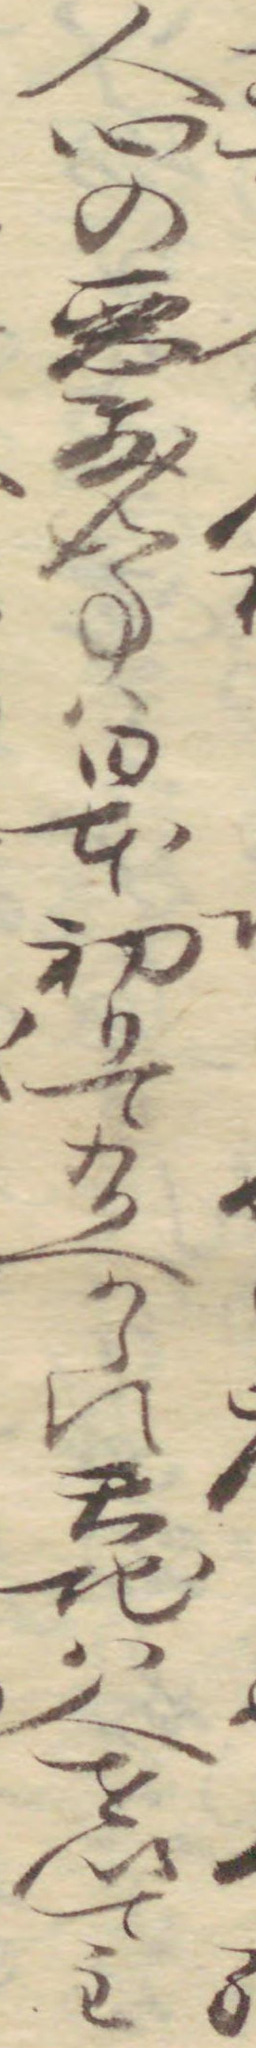人心の悪敷成事は日本初りて有へからす天地は人を以て主
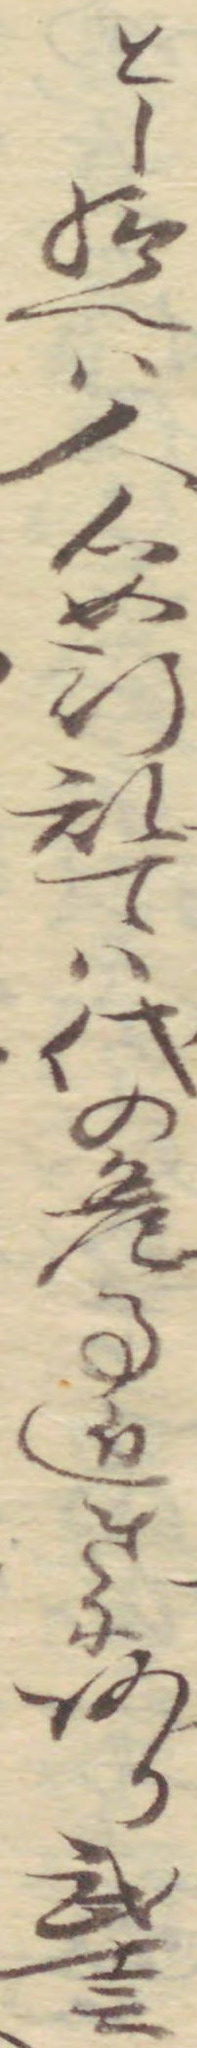とし給へは人心如斯乱ては代の危事近きにあり武士云
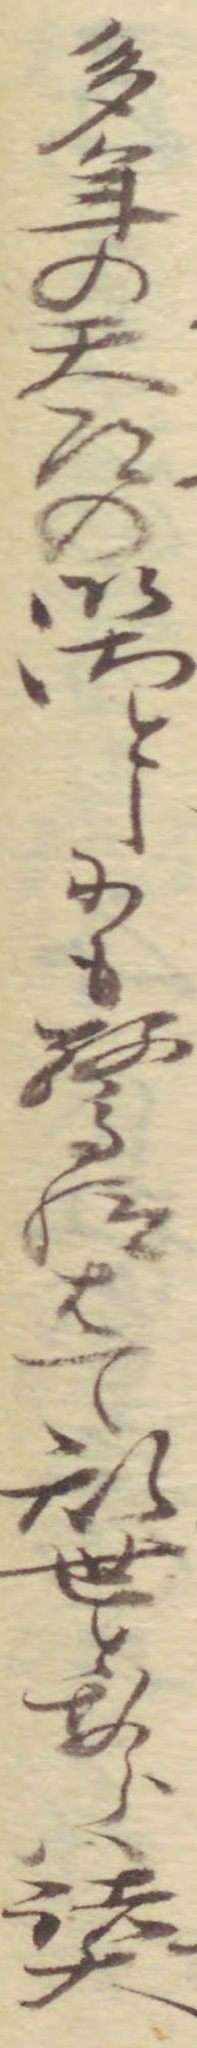多年の天道の御さとしにも驚給はて乱世とならは諸大
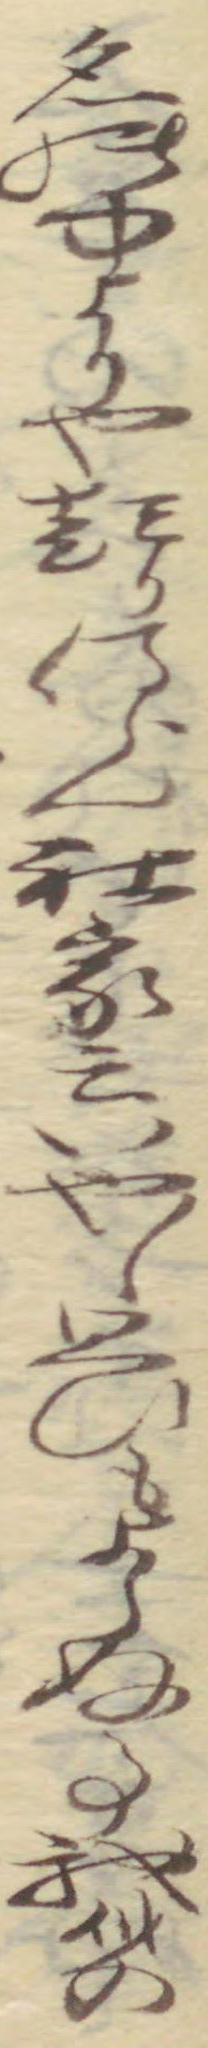名の中よりや起り侍らん社家云いや〳〵思ひもよらぬ事我身の
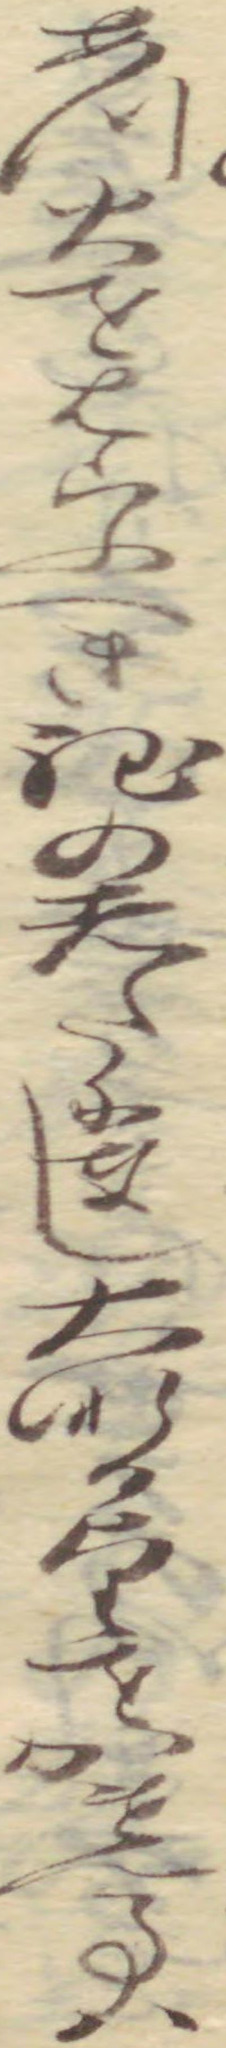あつ火をはらふへき程の者たになし大なる望をかけん事は
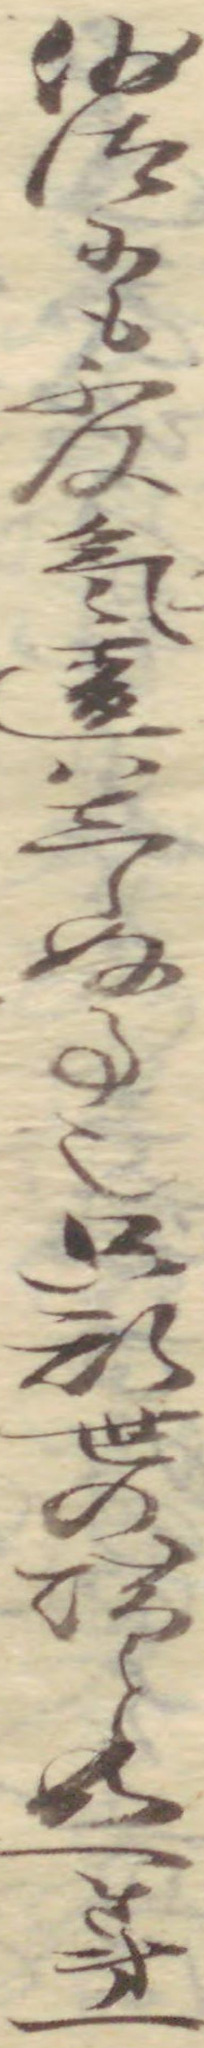沙汰にも不及気違はしらぬ事也只乱世の端と成へき第一
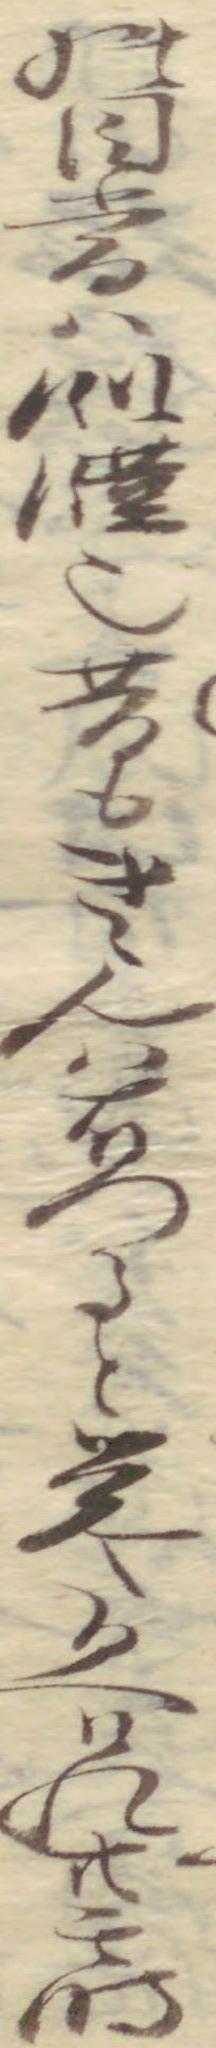の目当は飢饉也昔もきゝんは有つると覚えるへけれ共其時
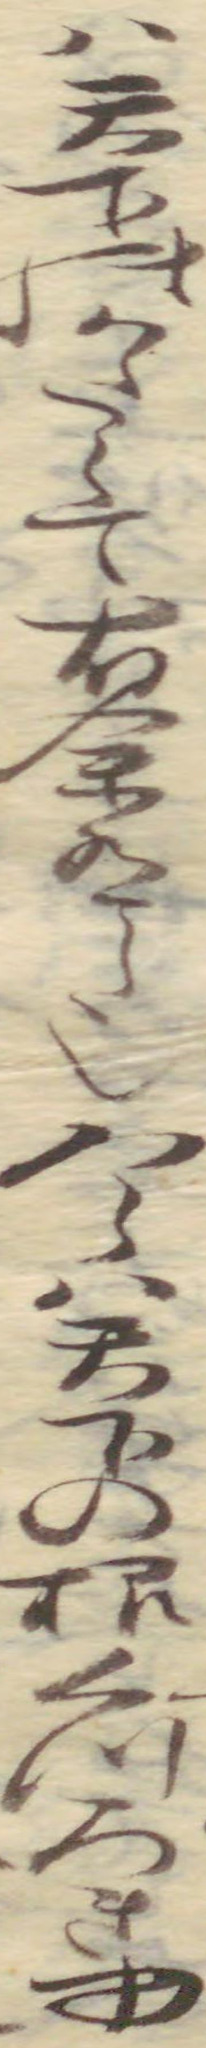は天下のかたらて有余有し也今は天下の根くつろきゆ
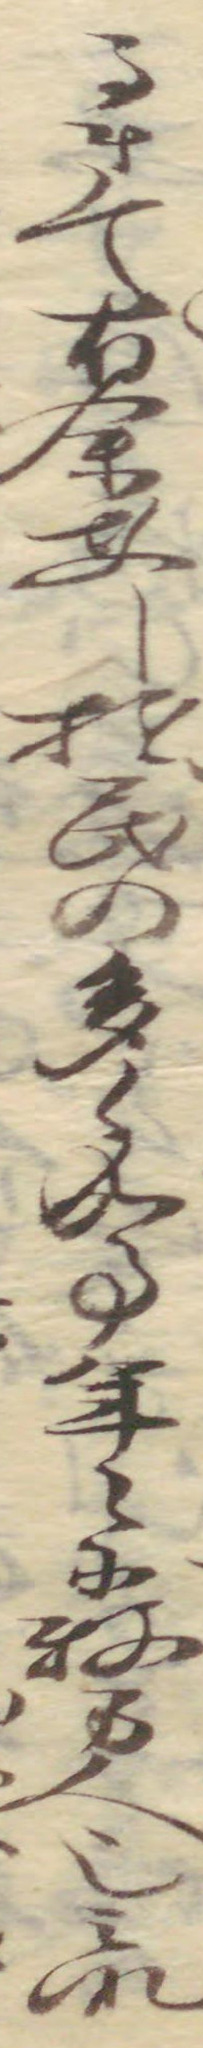るきて有余なし遊民の多く成事年〻に数万人也みな
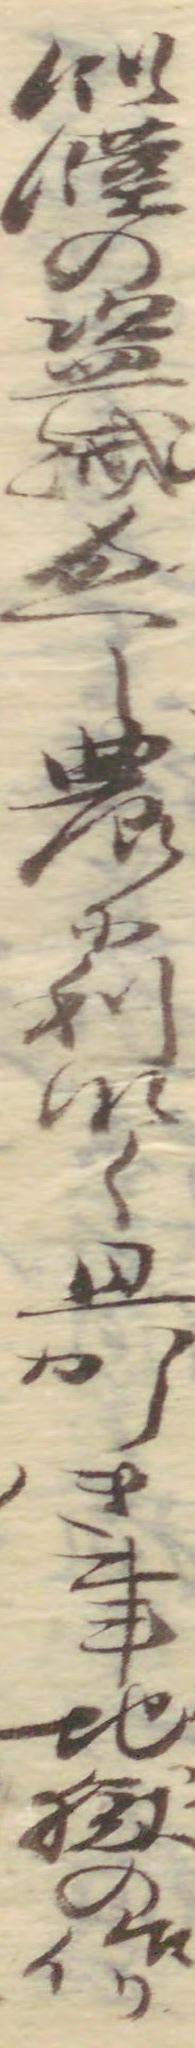飢饉の盗賊成へし農に利なく且からき事地獄の作り
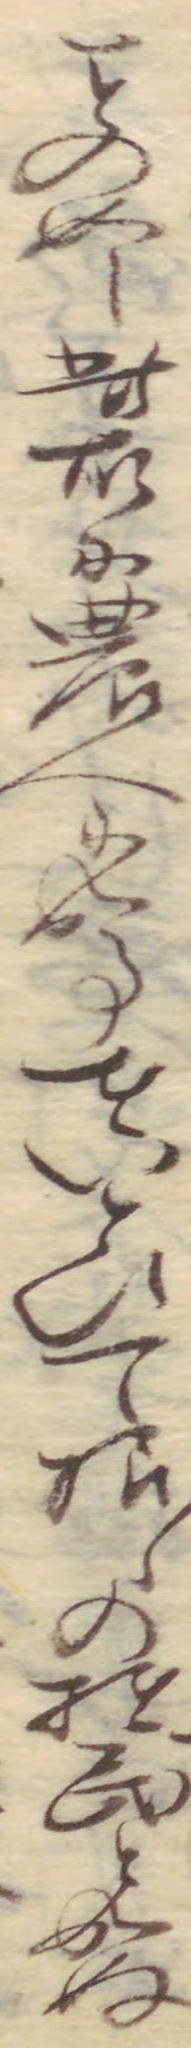ことの如し此故に農人に成事をいとひて様〳〵の遊民と成ぬ
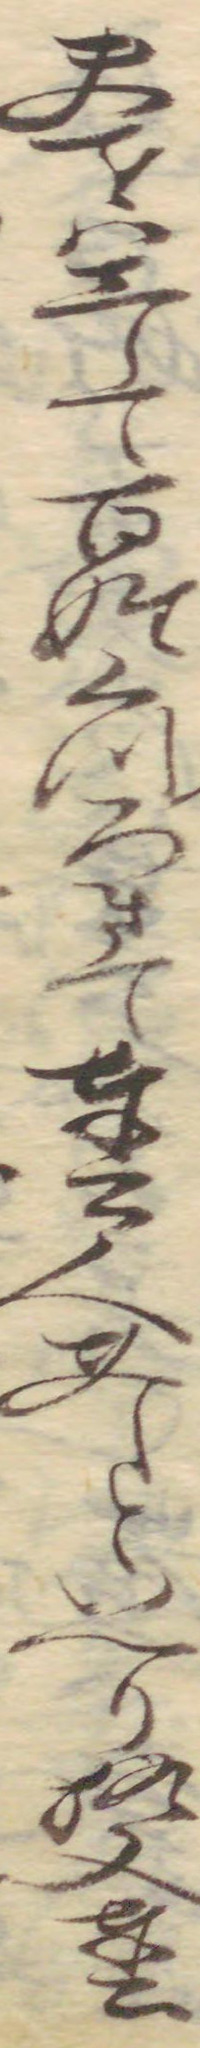夫をはしらて百姓くつろきて奉公人なしといへり猶又奉公
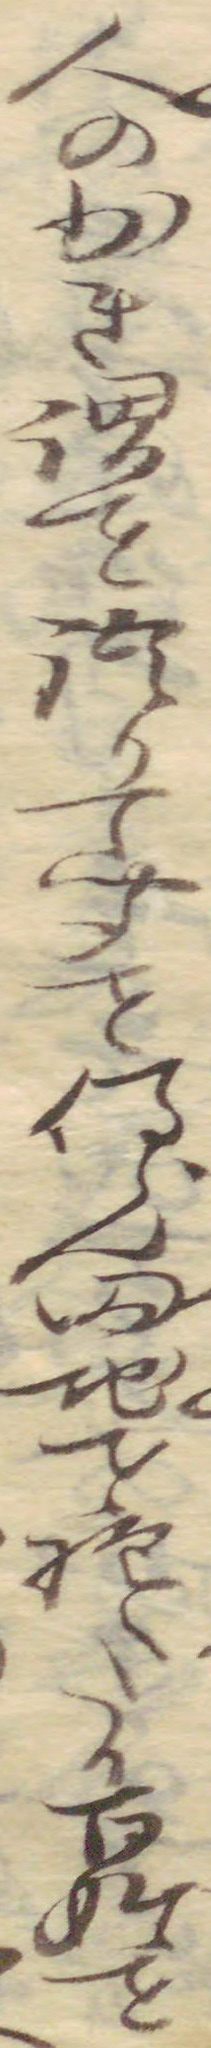人の少き謂を語りて聞せ侍らん田地を抱へたる百姓を
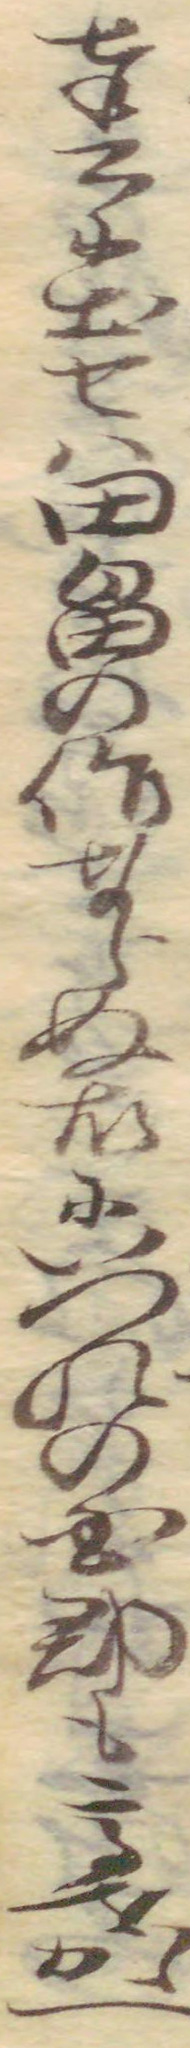奉公に出せは田畠の作ならぬ故にいつれの国郡も高をかゝへ

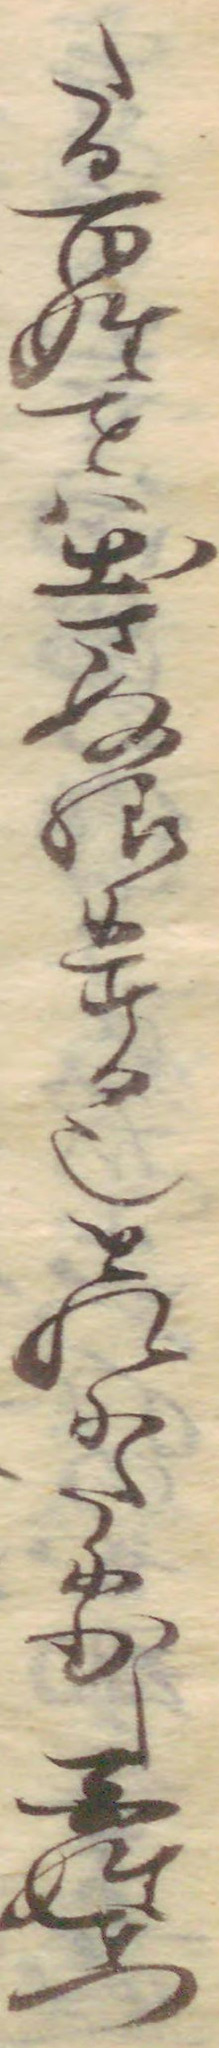たる百姓をは出さぬ様にする也それにたに少し百姓をつ
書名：鶯宿雑記. 巻263-264
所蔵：国立国会図書館 National Diet Library, JAPAN
